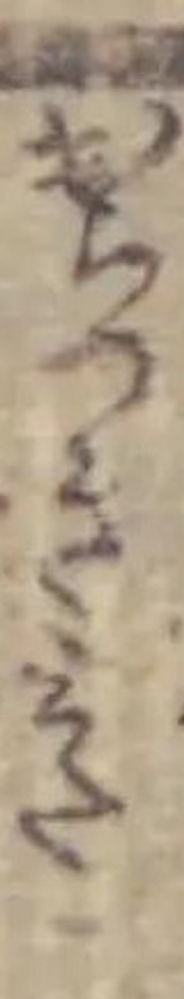おちつきみた
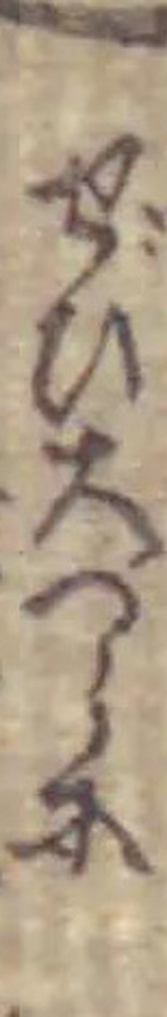ぜひ大つうに
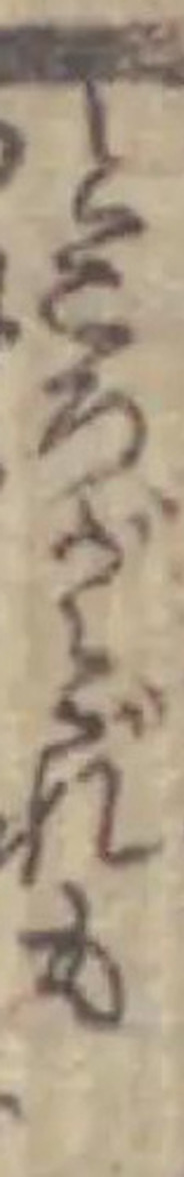ところがとれも
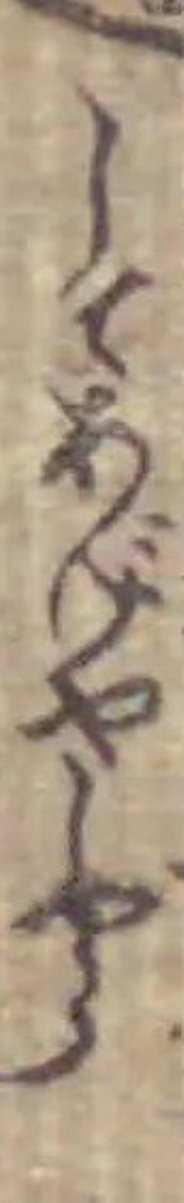してあげやしやう
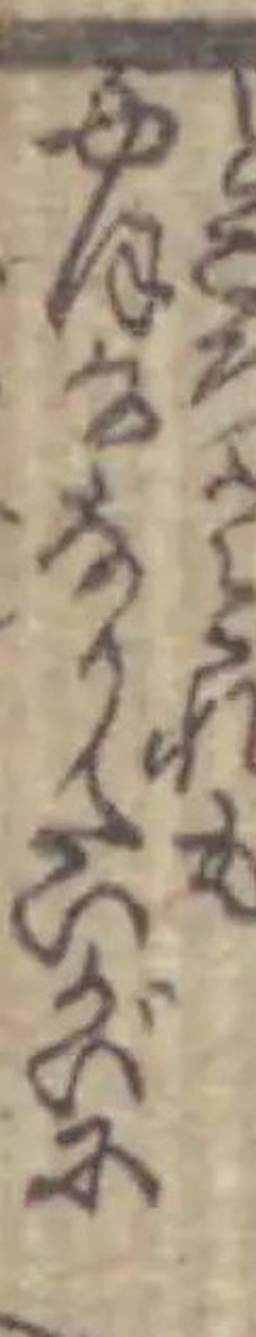やほななりたいがいに
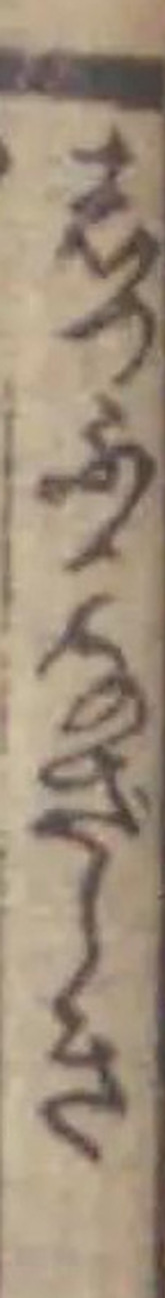しつふかなざしき
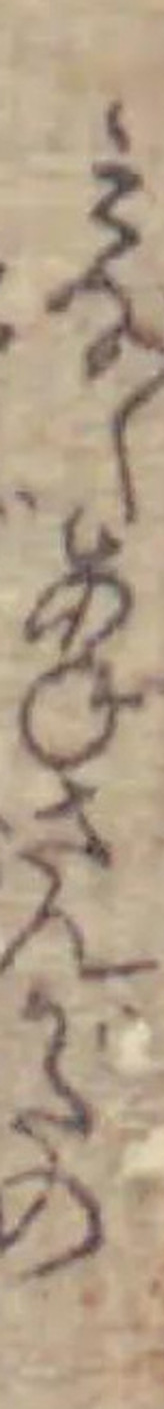みな〳〵あねさんがたの
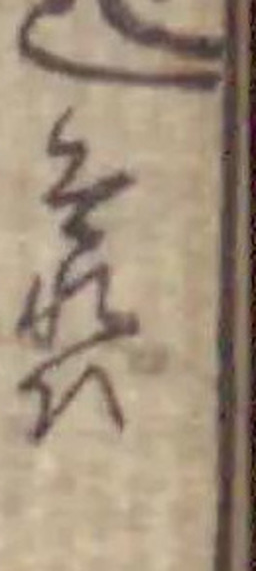それは
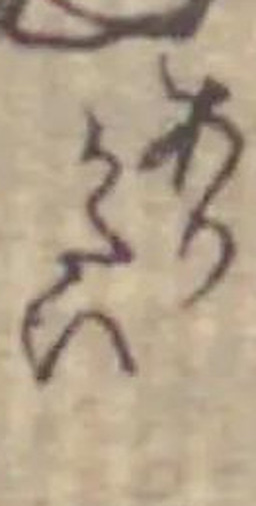かたい
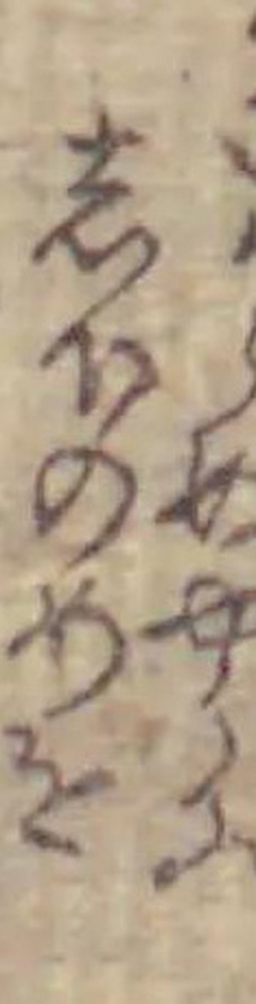しほのめを
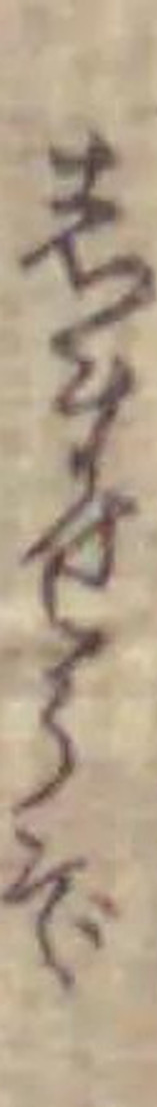しませうぞ
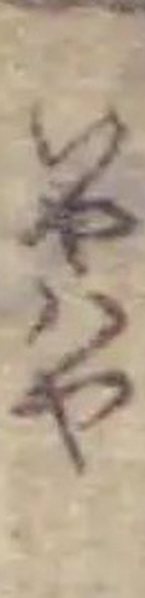いやはや
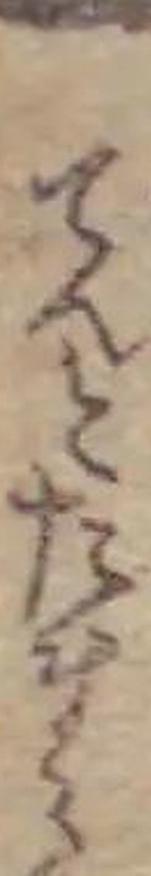てんとたまらぬ

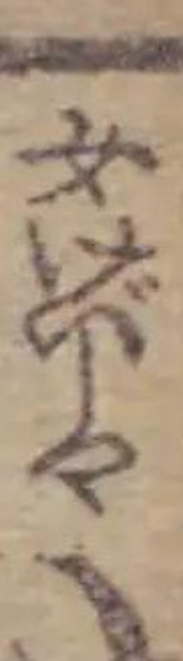女げいしや
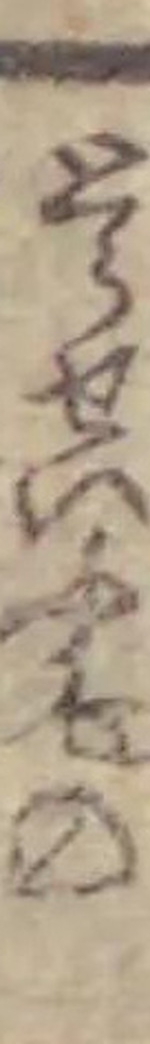とうせいふうの
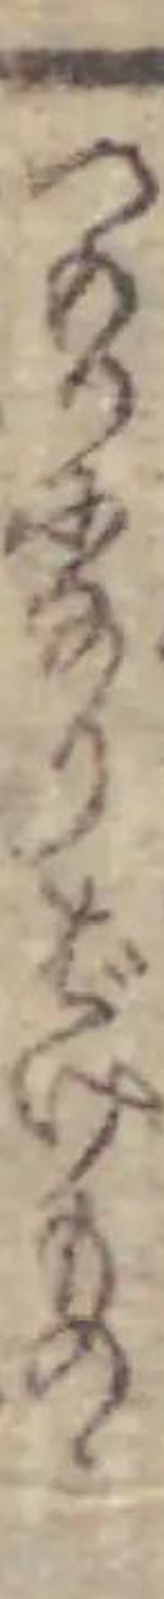つもりになりばけものゝ
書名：化物昼寝鼾 2巻
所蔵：国立国会図書館 National Diet Library, JAPAN
